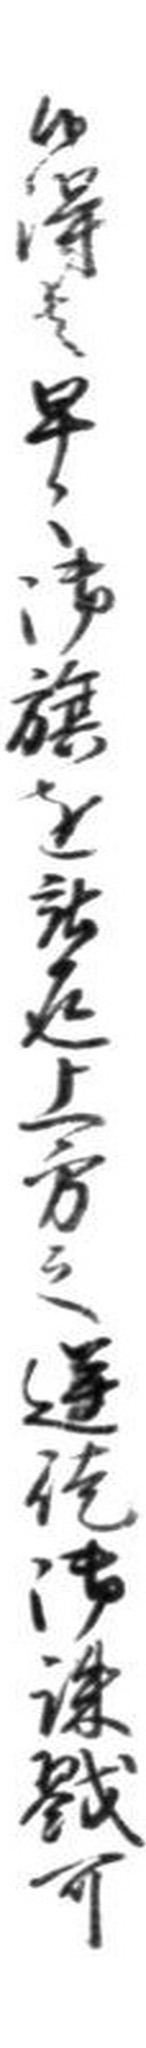候得者早々御旗を被返上方之逆徒御誅戮可
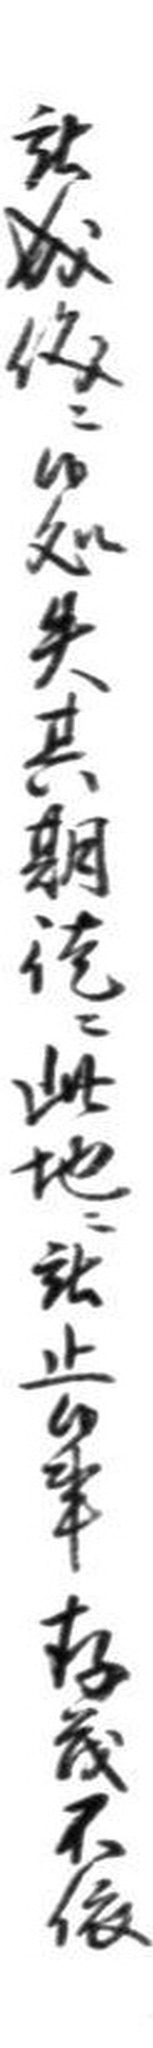被成儀ニ候処失其期徒ニ此地ニ被止候事存も不依
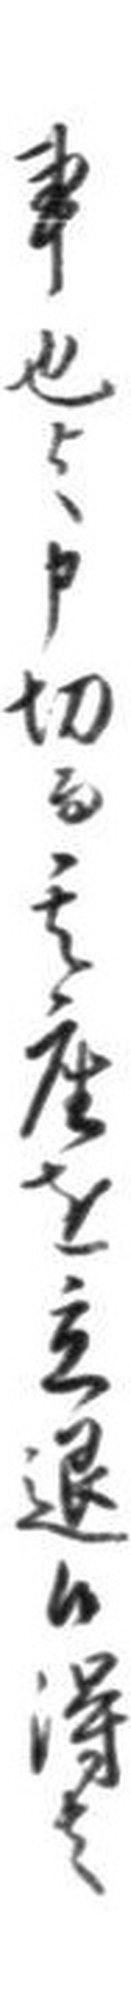事也と申切而其座を立退候得者
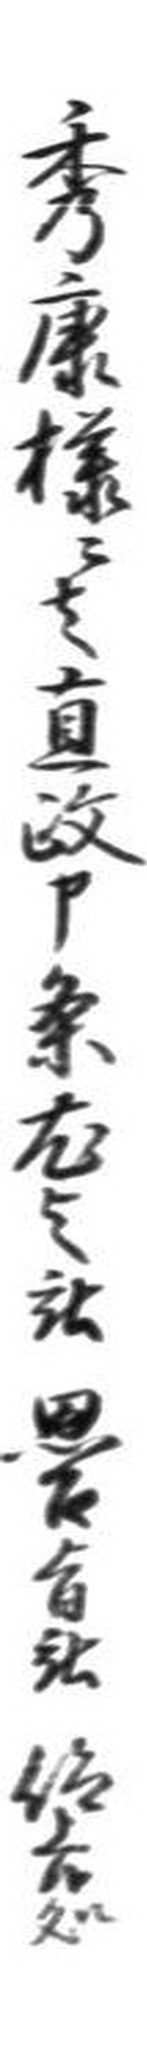秀康様ニ者直政申条尤と被思召旨被仰上候処
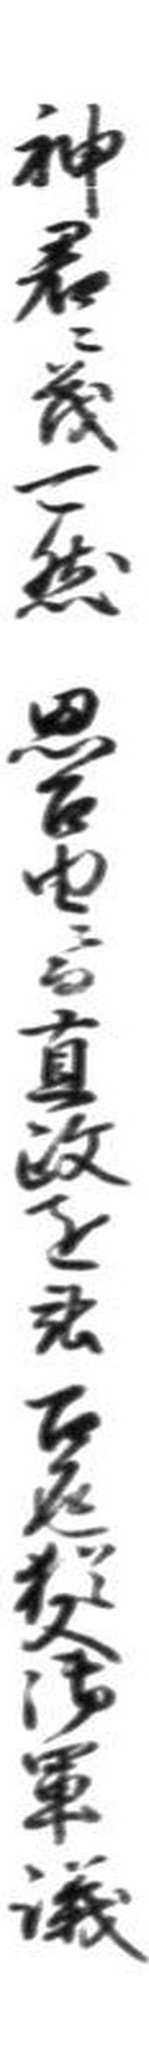神君ニも可然思召由ニ而直政を被召返猶又御軍議
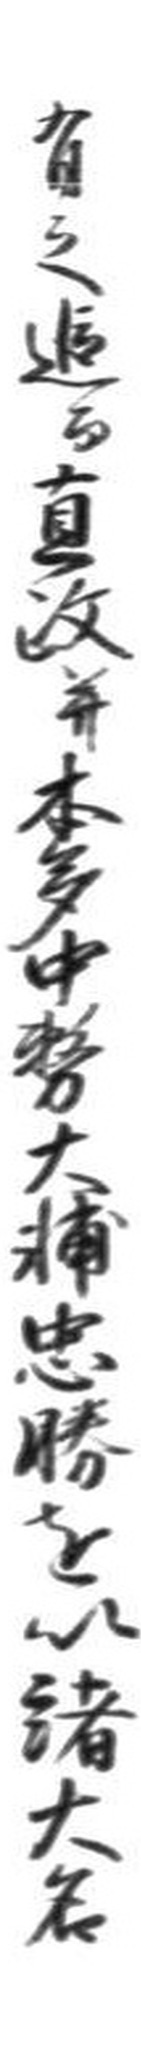有之追而直政并本多中務大輔忠勝を以諸大名
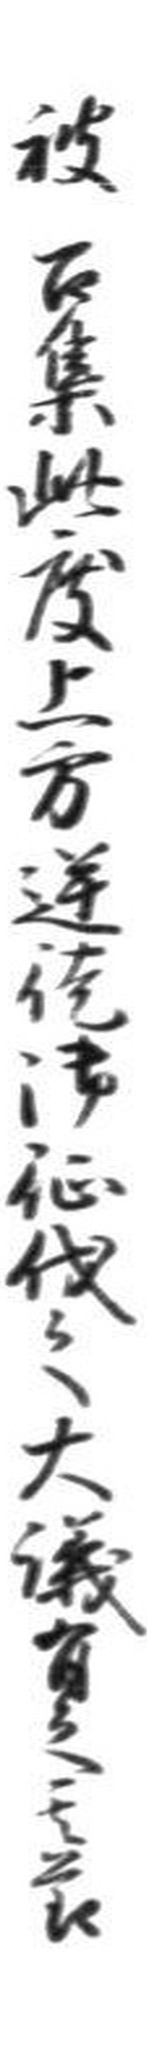被召集此度上方逆徒御征伐之大議有之其節
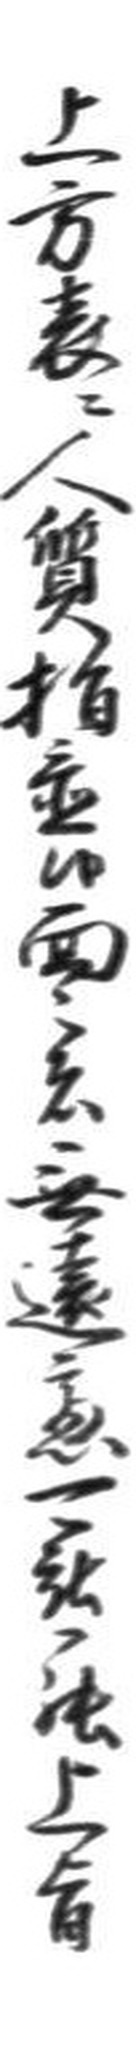上方表ニ人質指置候面々者無遠慮可被罷上旨
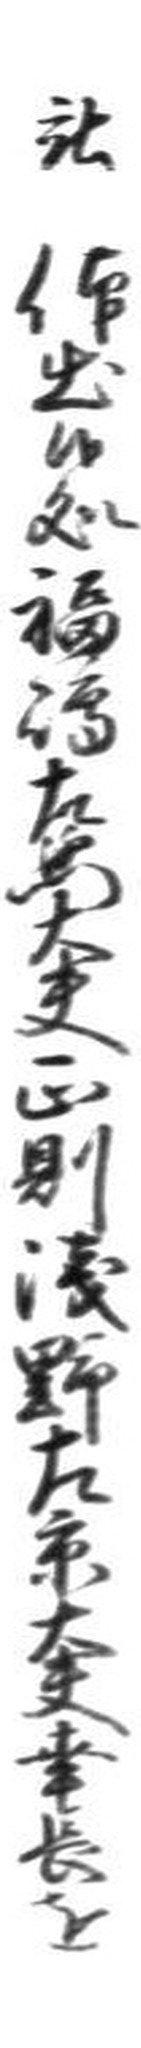被仰出候処福嶋左衛門大夫正則浅野左京大夫幸長を
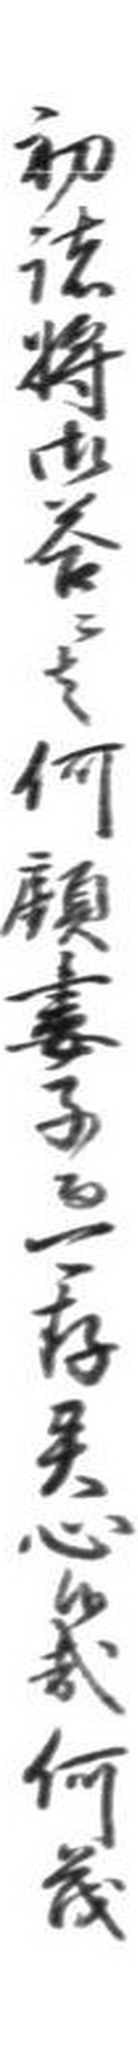初諸将御答ニ者何顧妻子而可存異心候哉何も
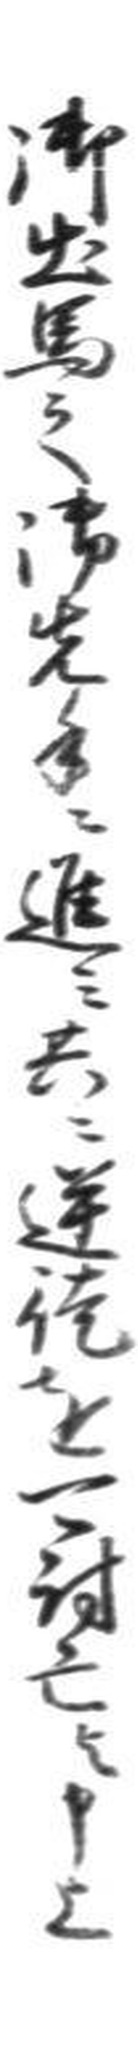御出馬之御先手ニ進ミ共ニ逆徒を可討亡と申上
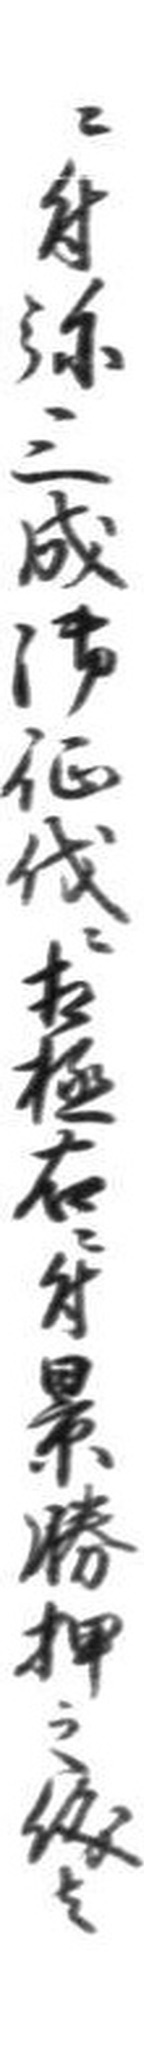ニ付弥三成御征伐ニ相極右ニ付景勝押之儀者

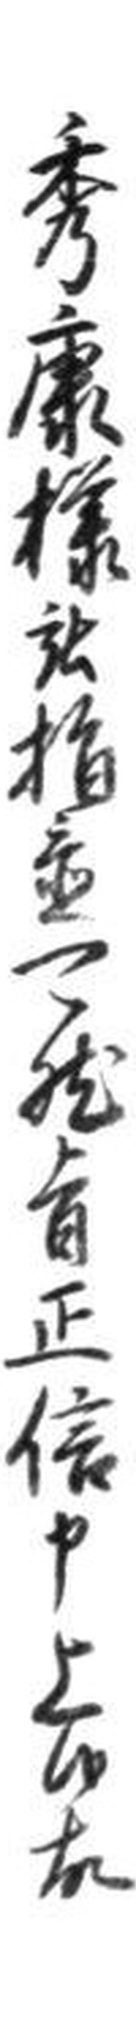秀康様被指置可然旨正信申上候故
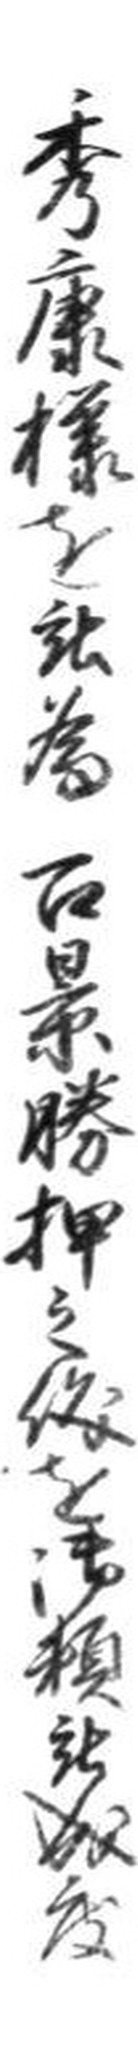秀康様を被為召景勝押之儀を御頼被成度
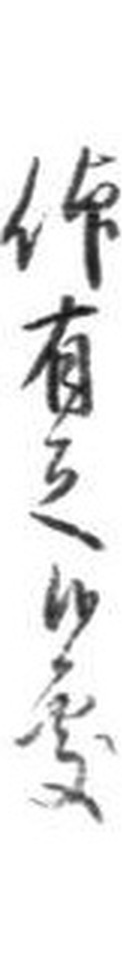仰有之候処
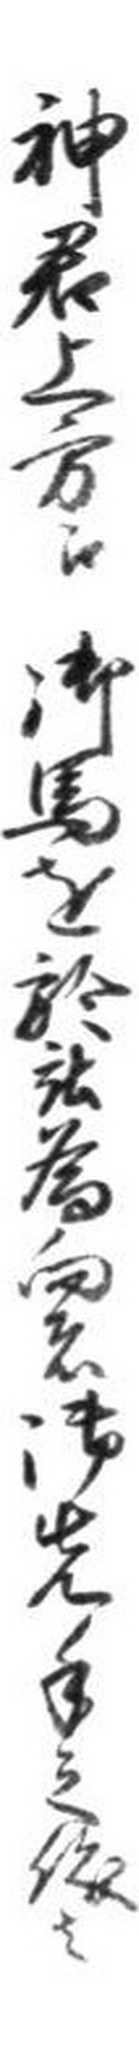神君上方江御馬を於被為向者御先手之儀者
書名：家譜 一 秀康公 従天正二年到慶長十二年
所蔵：福井県文書館 Fukui Prefectural Archives
